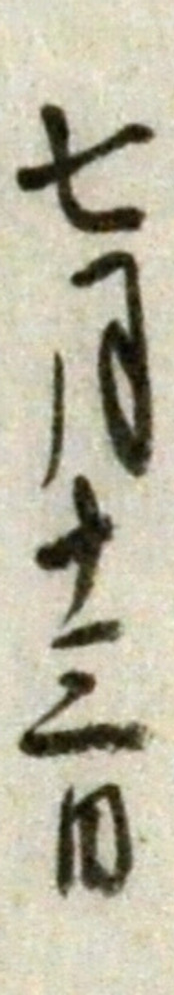七月十三日
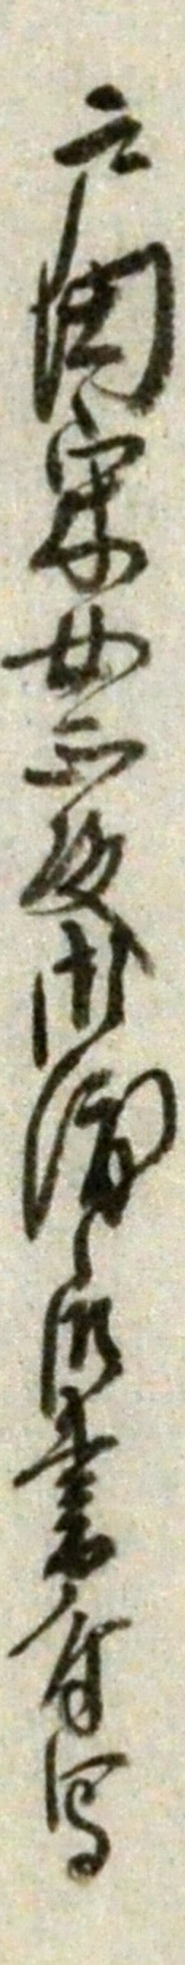戸田采女正殿御渡之御書付写
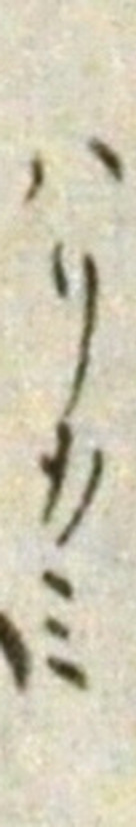ハリカミ
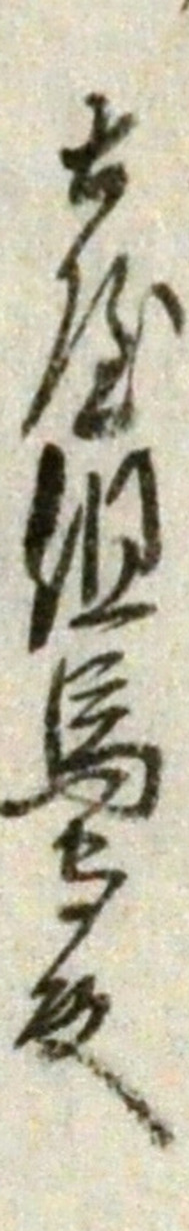土屋但馬守殿
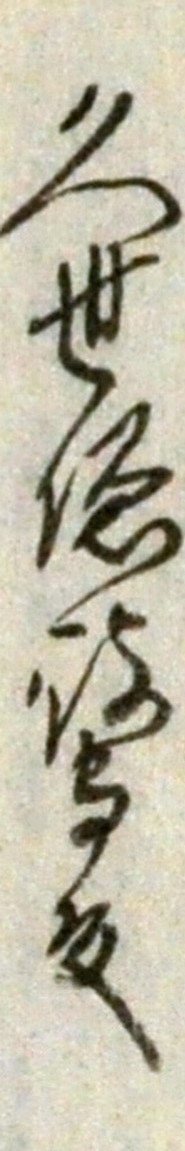久世隠岐守殿
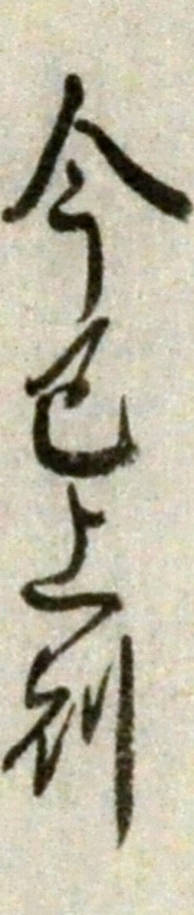今巳上刻
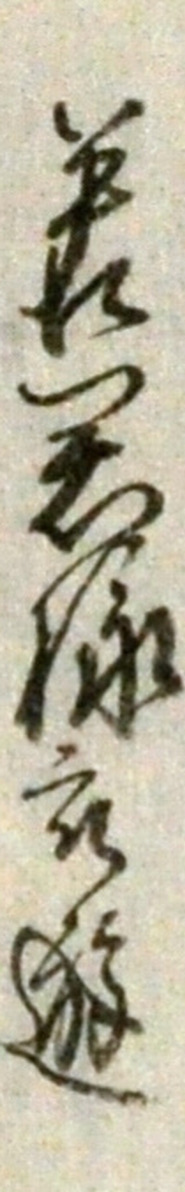若君様被遊
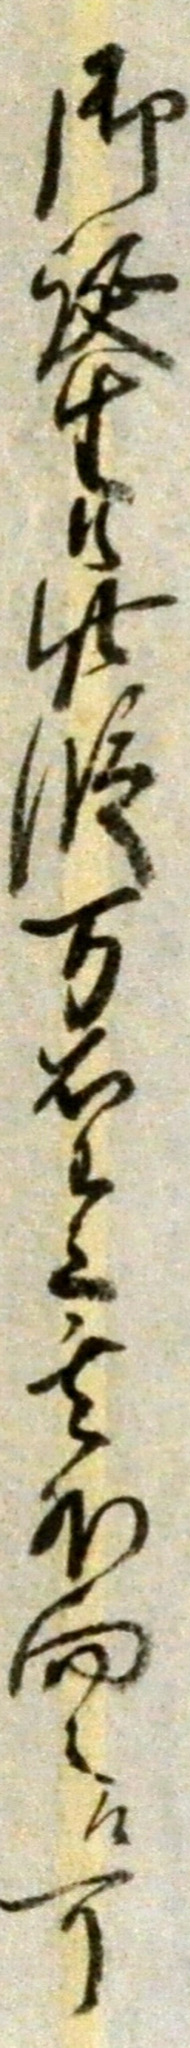御誕生候此段万石已上其外向々え可
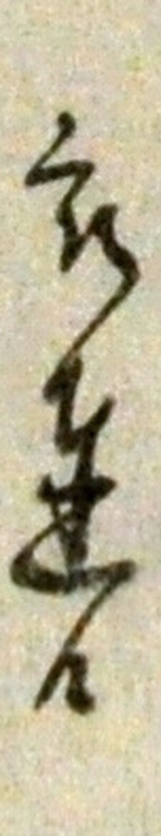被達候
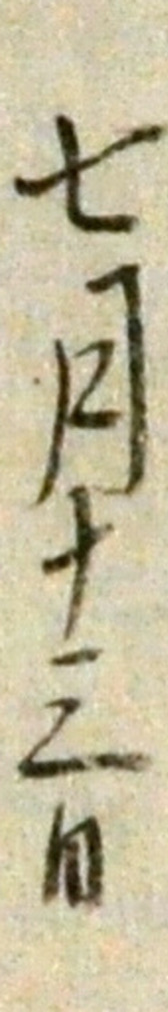七月十三日
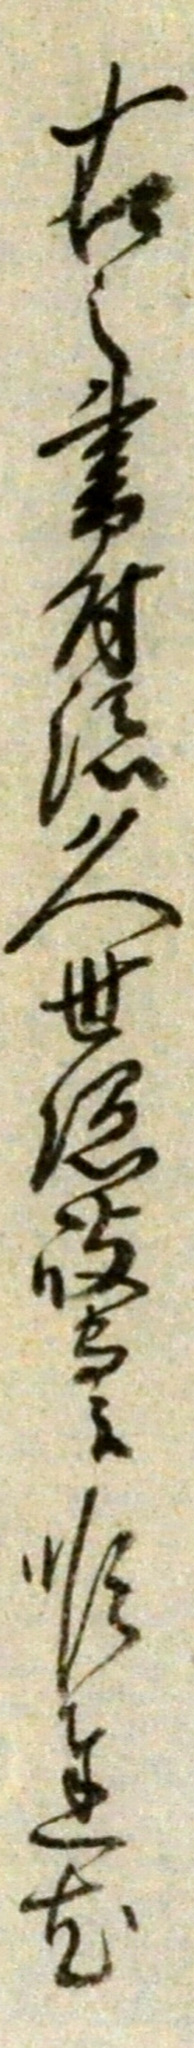右之書付認久世隠岐守え順達尤
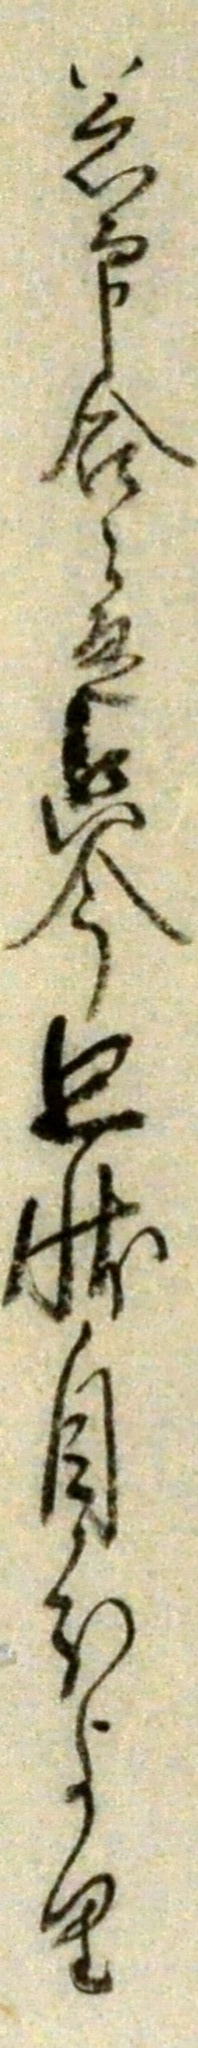兼而申合之通只今廻状自分より
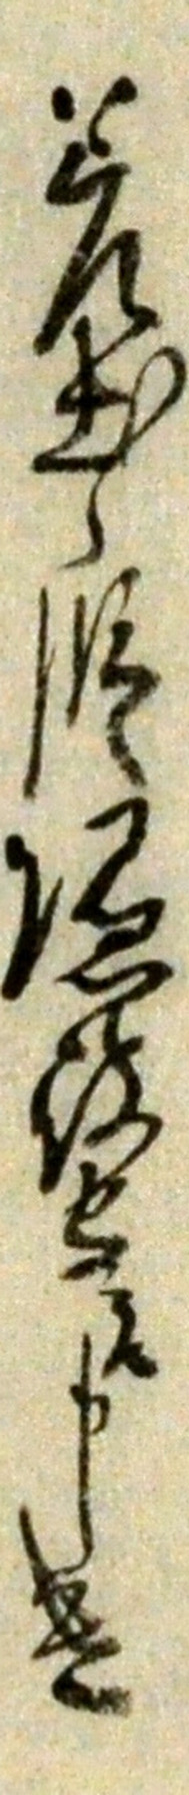差出候段隠岐守え申遣
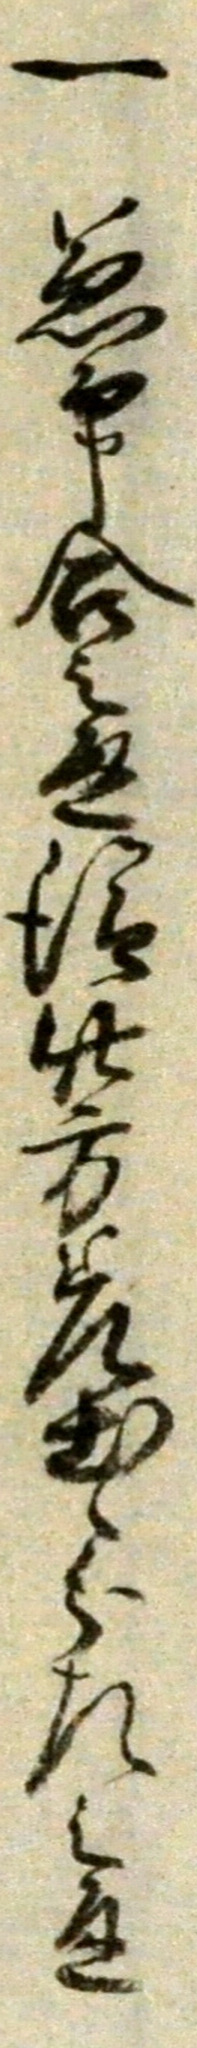一兼而申合之通従此方差出候分左之通
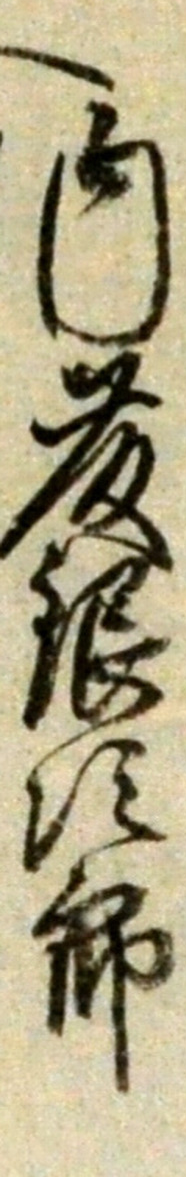内藤銀次郎
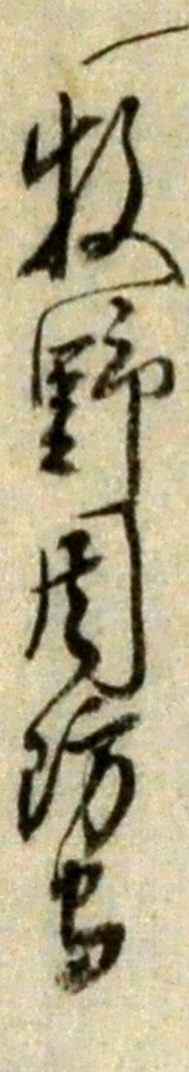牧野周防守
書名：若君様（家斉嫡男）誕生諸祝儀ノ節ノ留書外
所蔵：伊那市立高遠町図書館・合同会社AMANE
